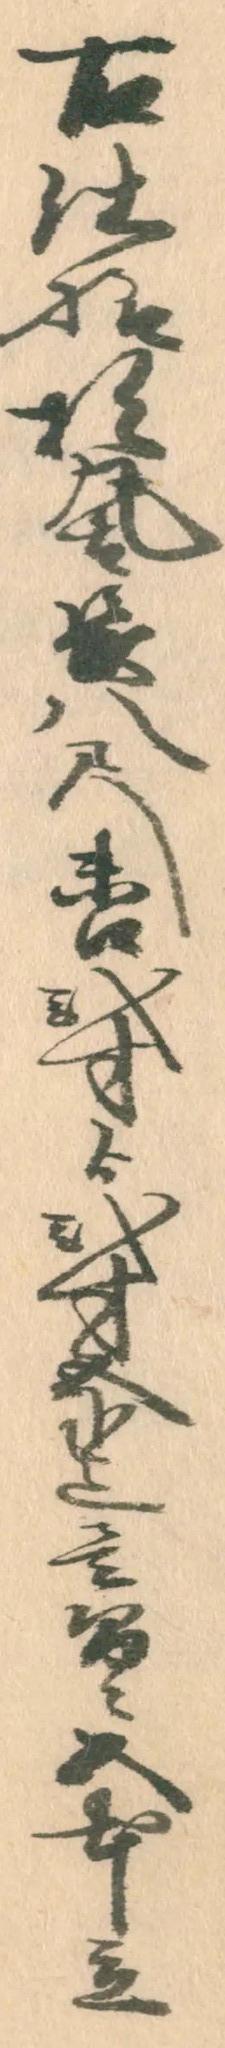右仕様松丸太長八尺末口弐寸ゟ弐寸五分迄壱間ニ五本立
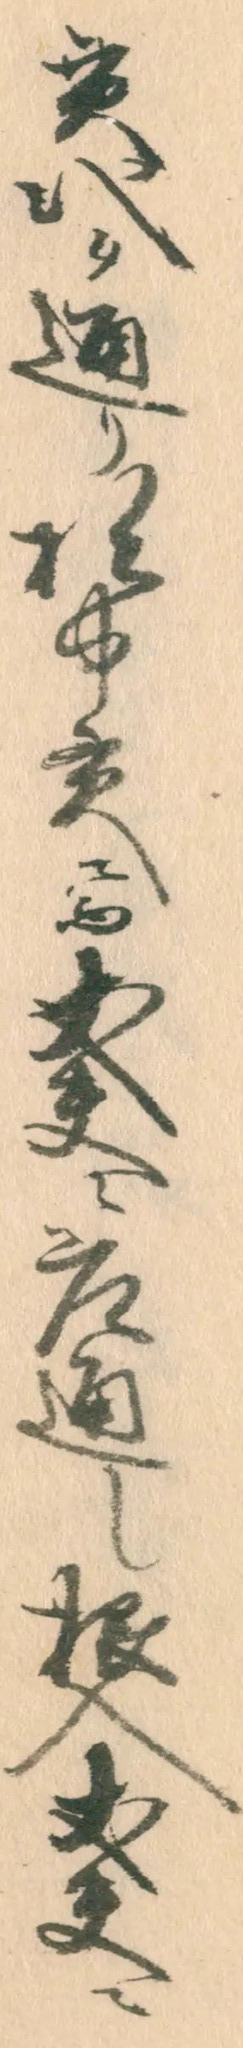貫弐タ通り柱中貫ニて丈夫ニ差通し根入丈夫ニ
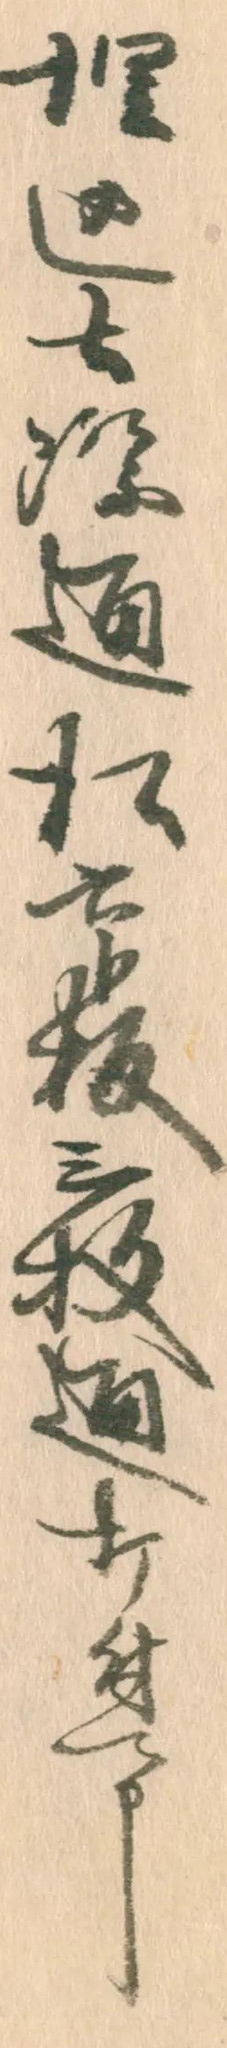埋込土際通松六分板三枚通打付可申
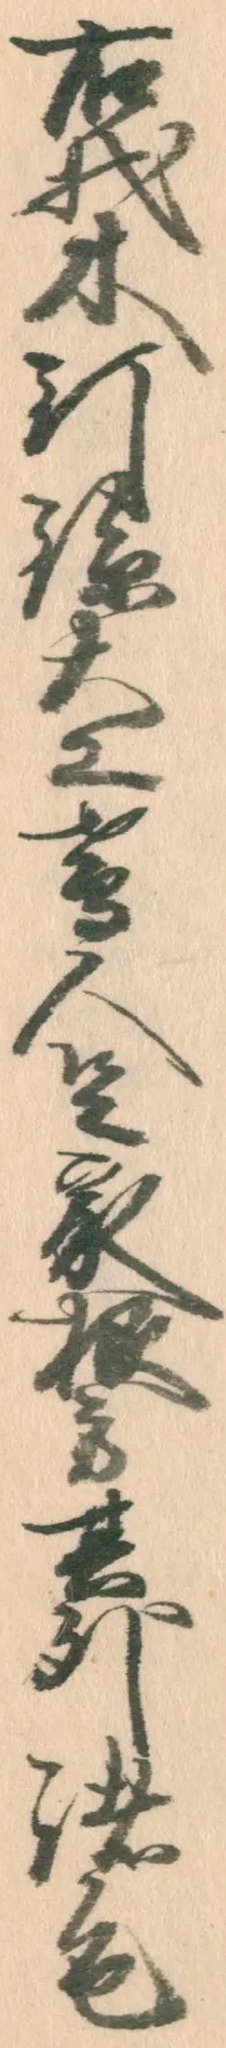右材木釘銯大工鳶人足家根方其外諸色
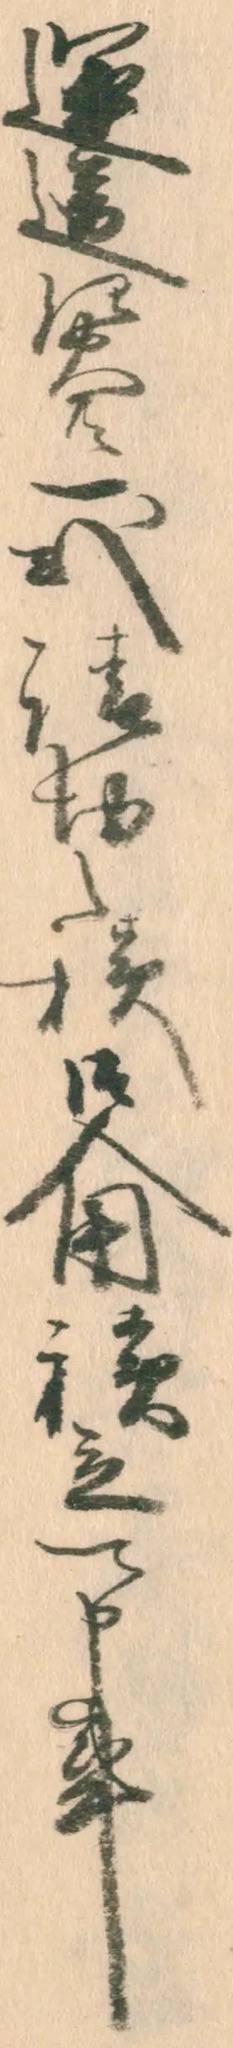運送賃共一式請切之積御入用積立可申事
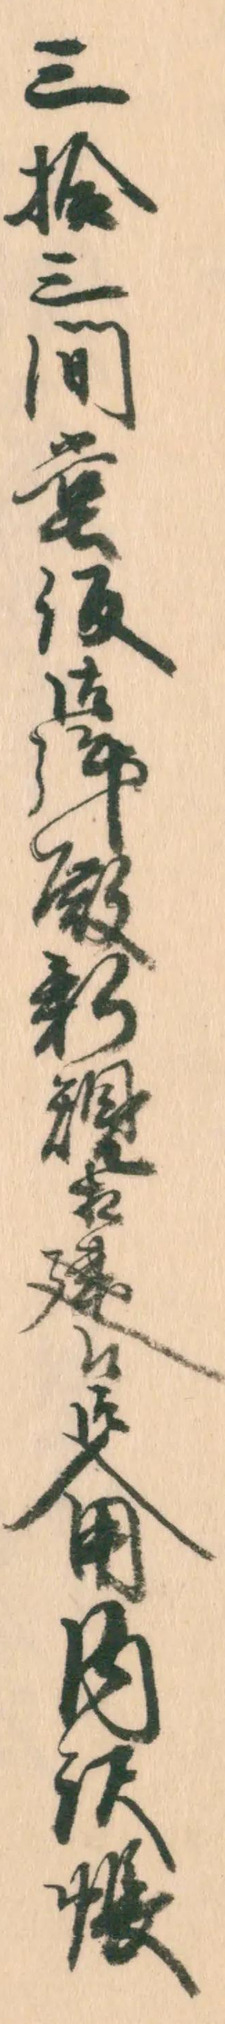三拾三間堂仮御拝殿新規相建候御入用内訳帳

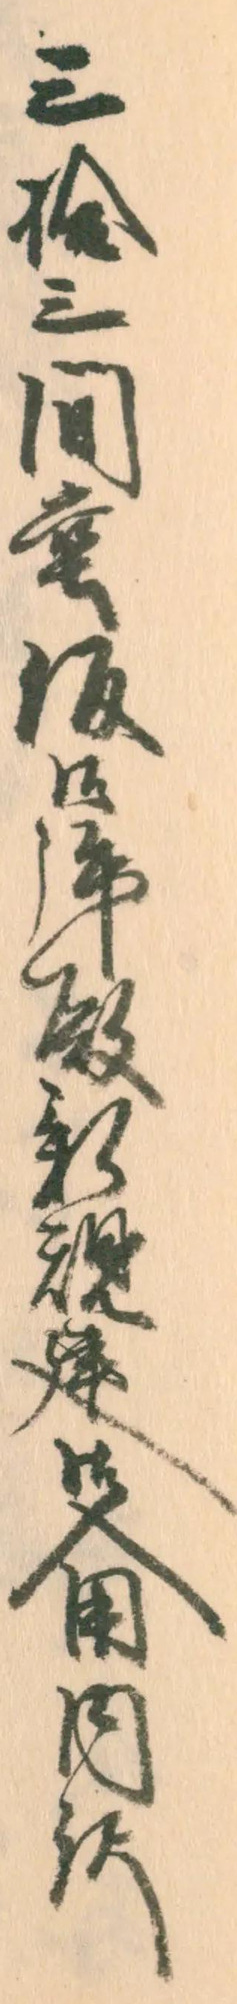三拾三間堂仮御拝殿新規建御入用内訳
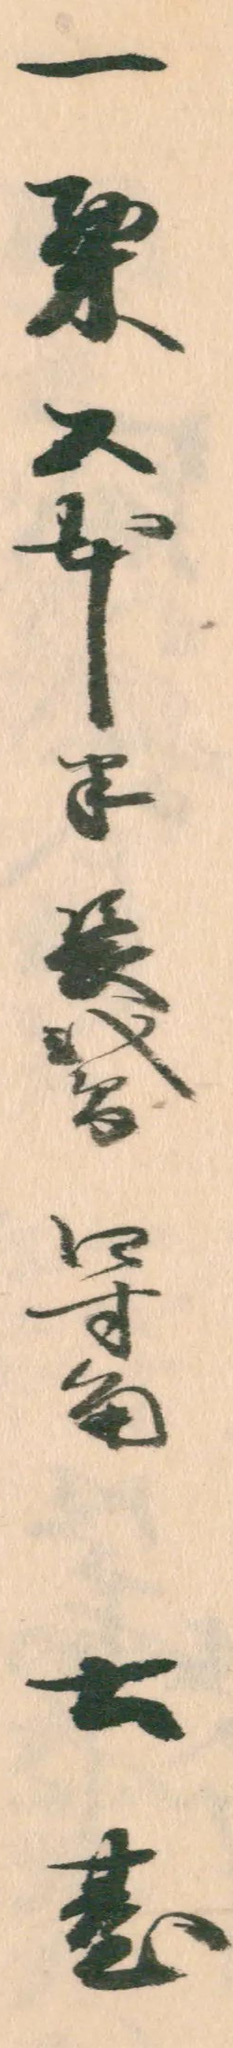一栗五本半長弐間四寸角土台
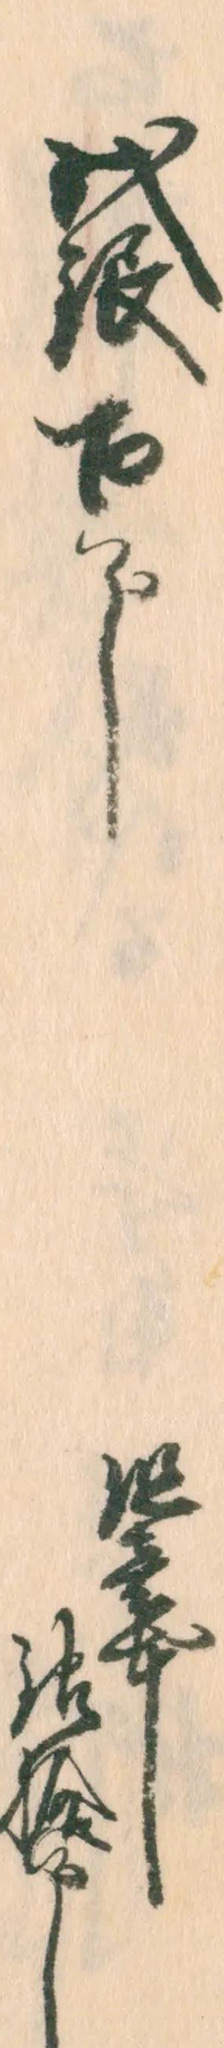代銀百匁但壱本銀拾匁
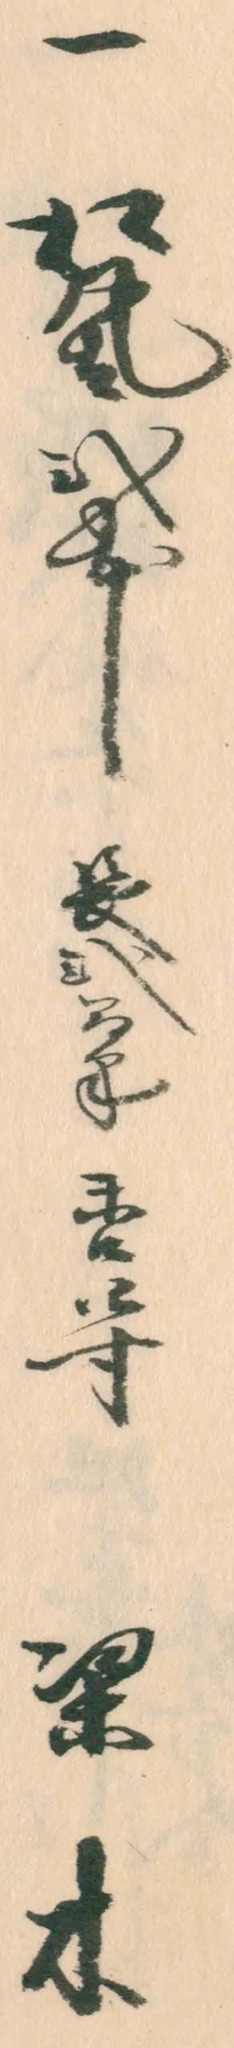一松丸太弐本長弐間半末口四寸梁木

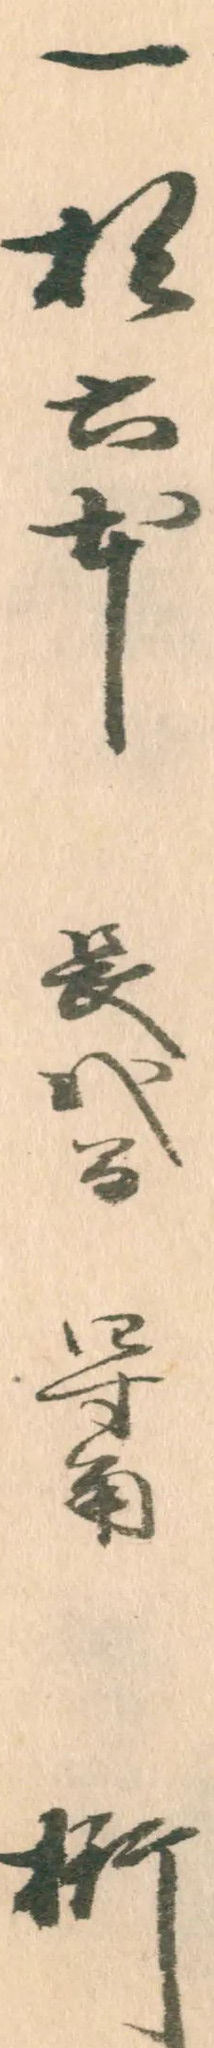一松六本長弐間四寸角桁
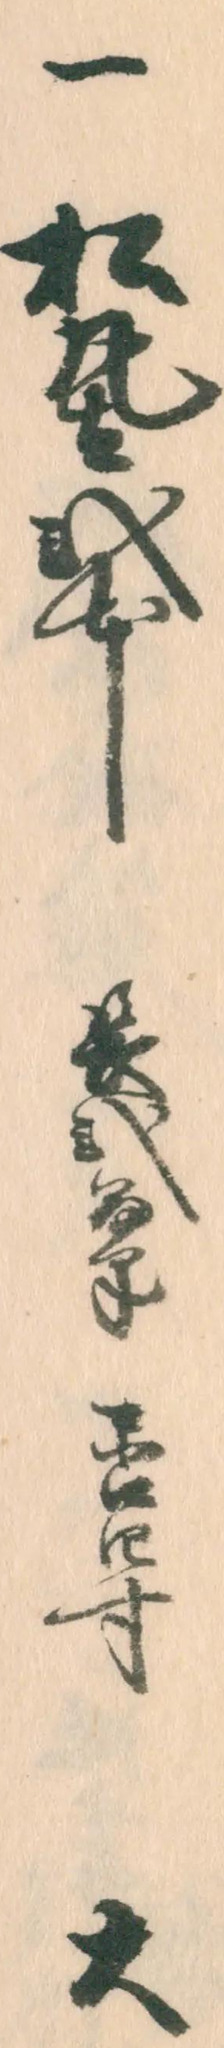一松丸太弐本長弐間半末口四寸大引

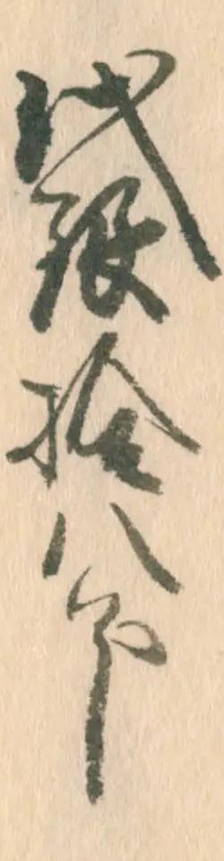代銀六拾匁
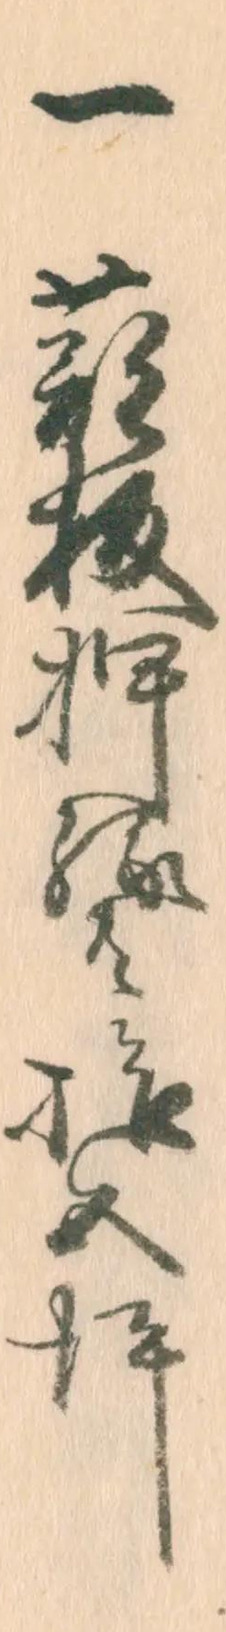一蔀板押縁共拾五坪
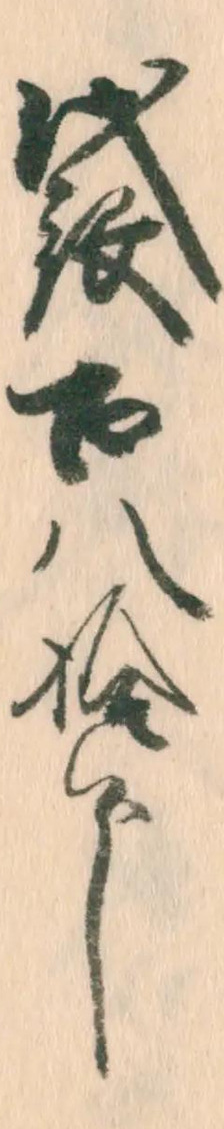代銀六拾匁
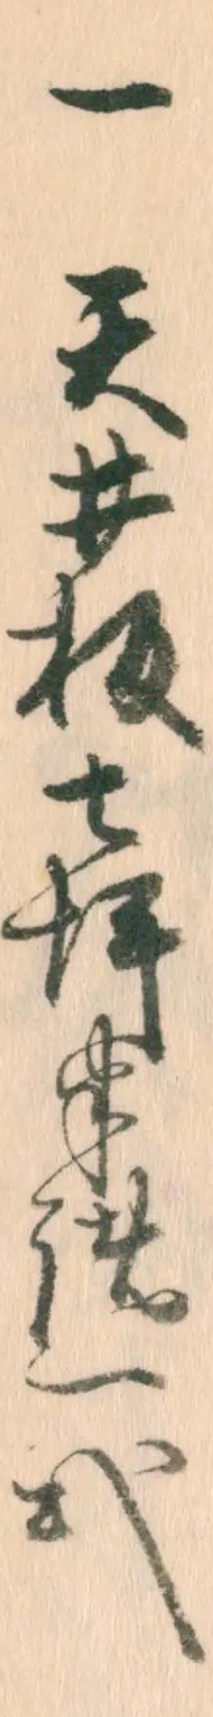一天井板七坪半諸一式
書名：三十三間堂. [2]
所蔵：国立国会図書館 National Diet Library, JAPAN
